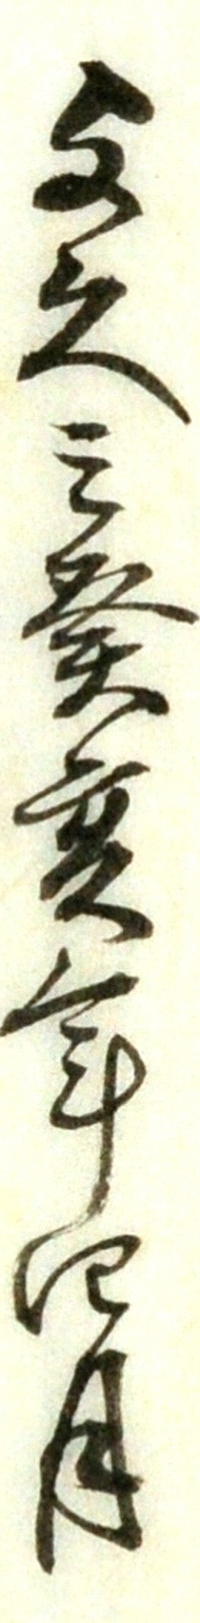文久三癸亥年四月
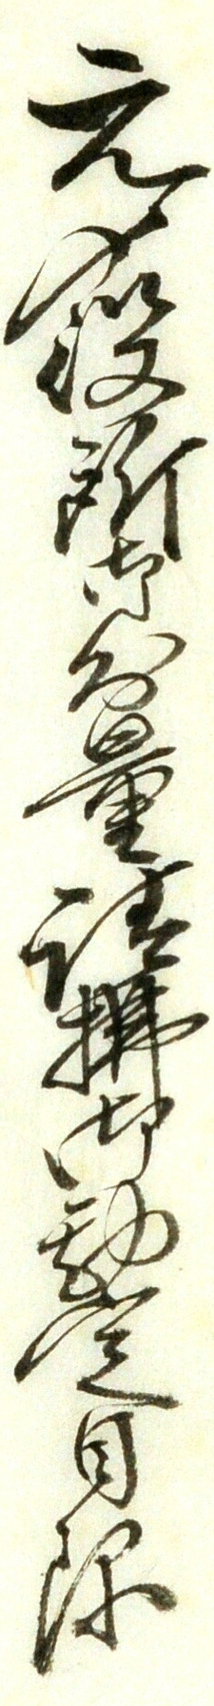元〆役所御分量請払御勘定目録

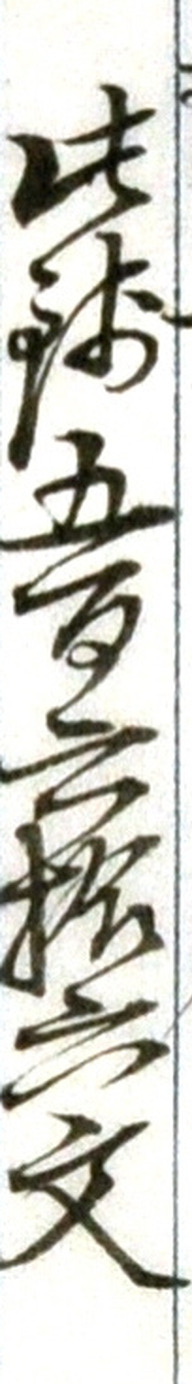此銭五百六拾六文

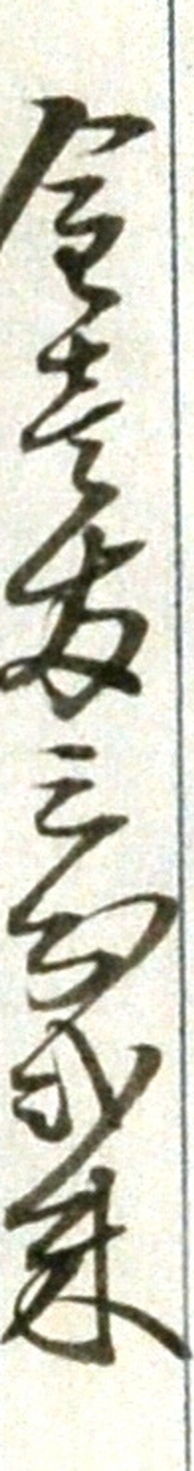金壱両三分弐朱
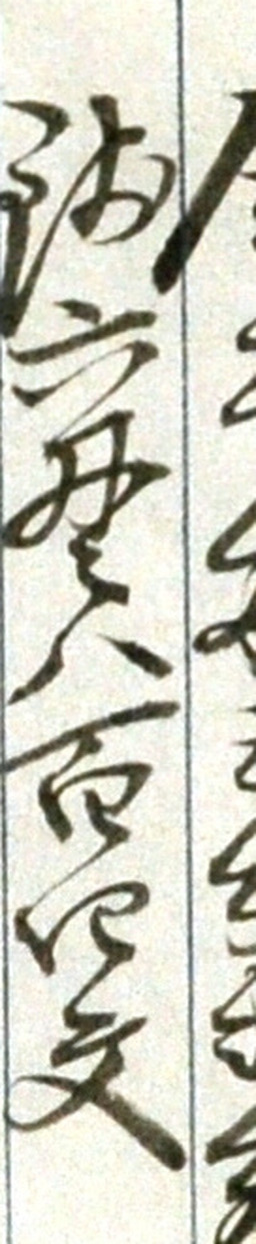銭六貫八百四文
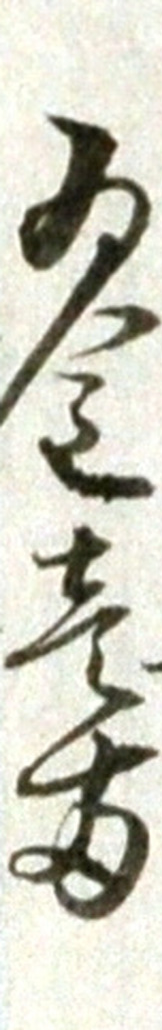為金壱両
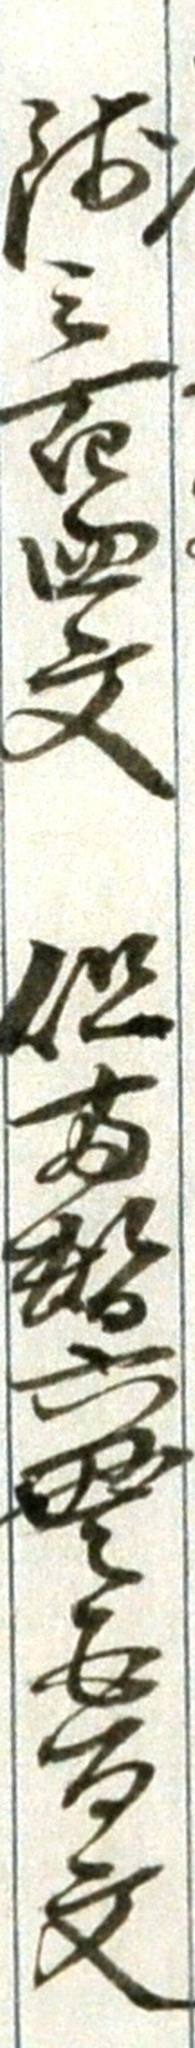銭三百四文但両替六貫五百文
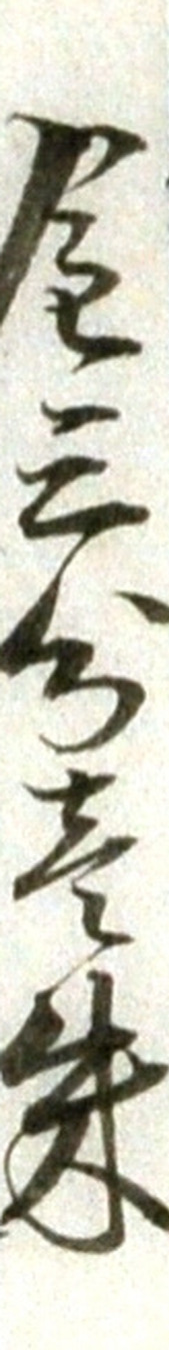金三分壱朱
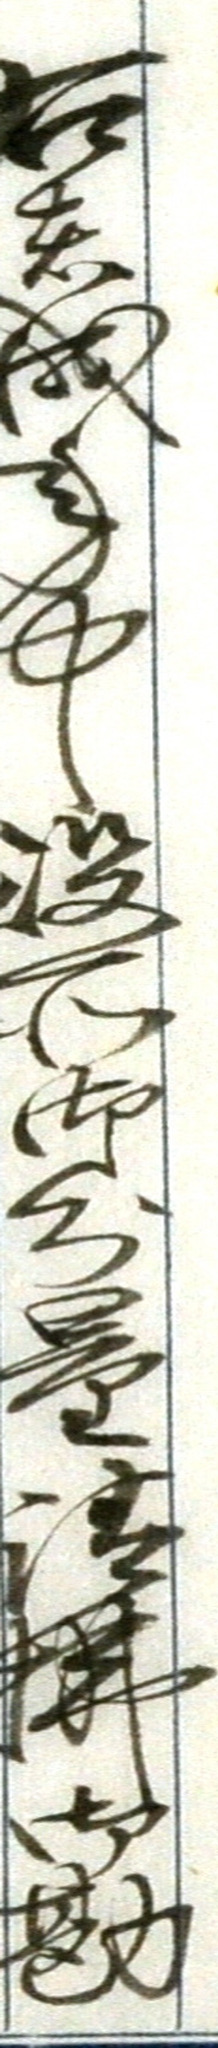右者戌年中役所御分量請払御勘
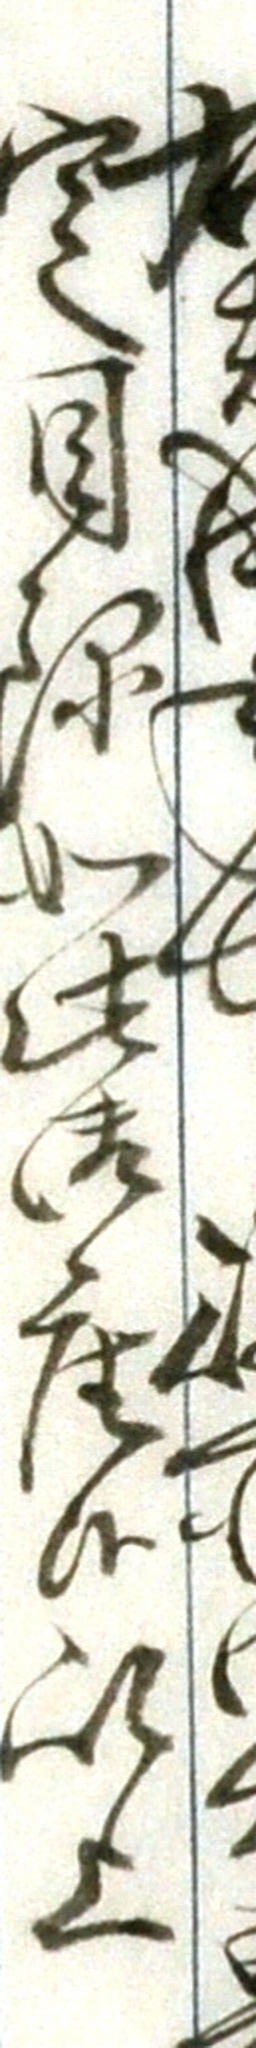定目録如此御座候以上
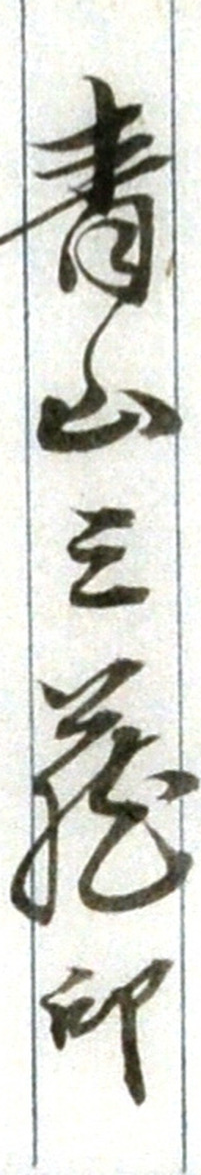青山三蔵印
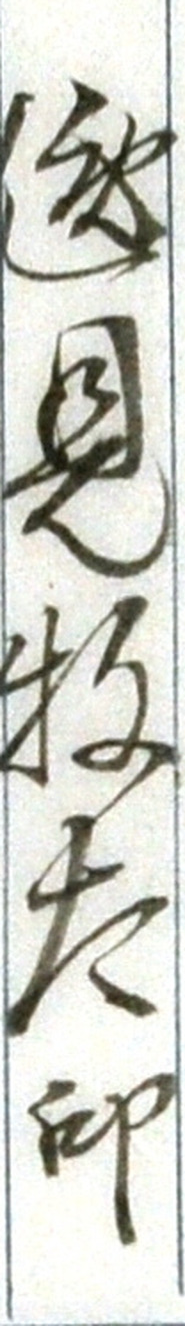逸見牧太印
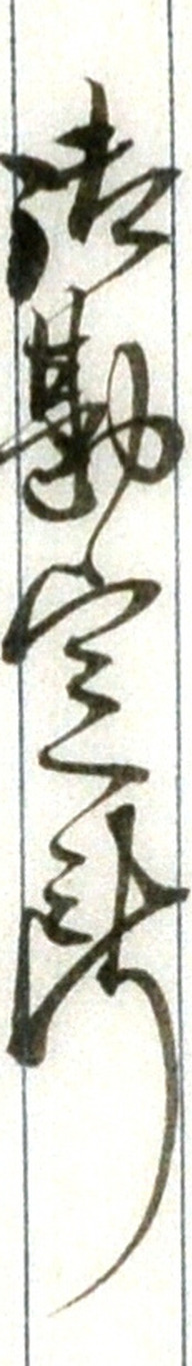御勘定所

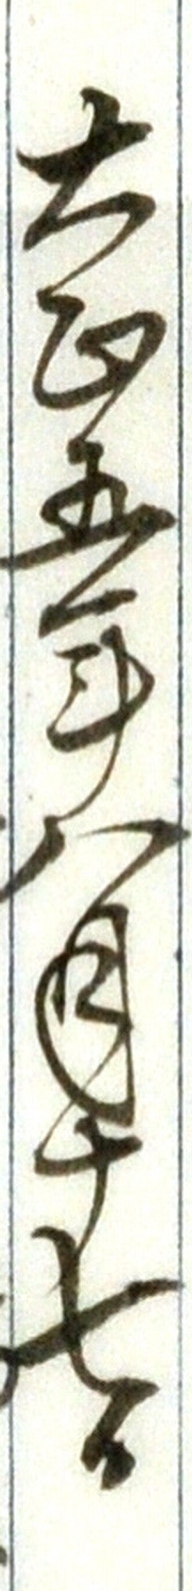大正五年八月十七日
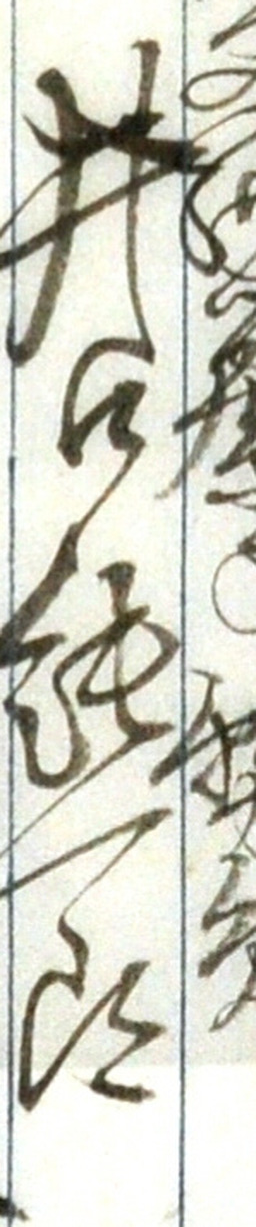井口純一郎
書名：元〆役所御分量受払御勘定目録
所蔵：伊那市立高遠町図書館・合同会社AMANE
